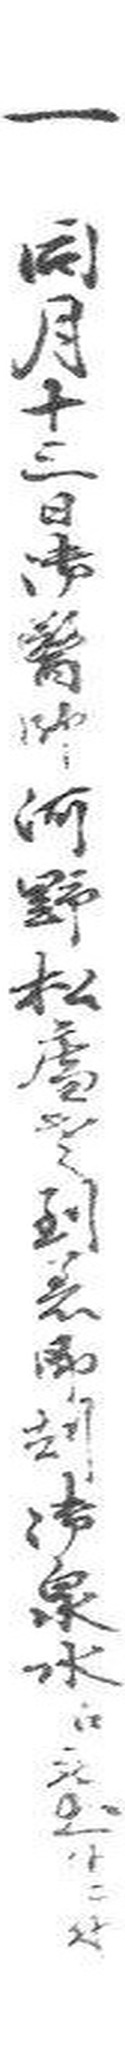一同月十三日御医師河野松庵老到着則刻御泉水江罷出候ニ付
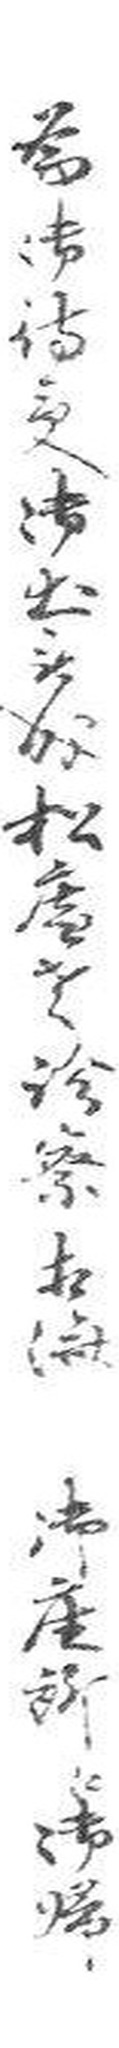為御待受御出被成松庵老診察相済御座所江御帰
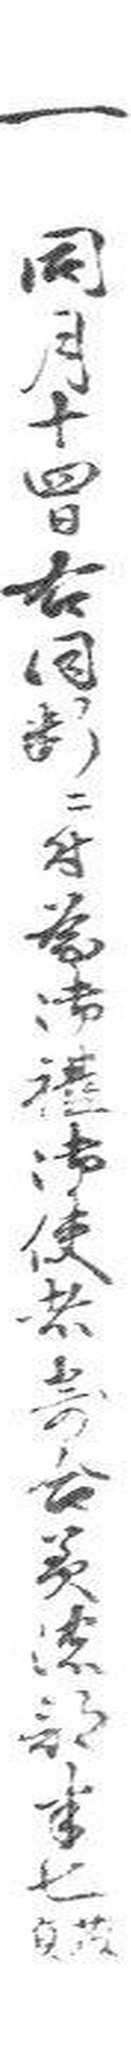一同月十四日右同断ニ付為御礼御使者寄合美濃部半七茂貞
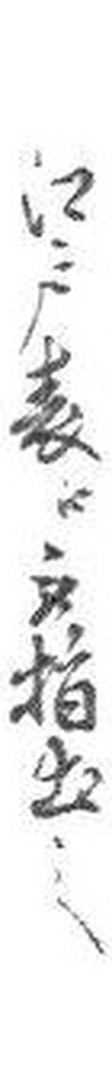江戸表江被指出之
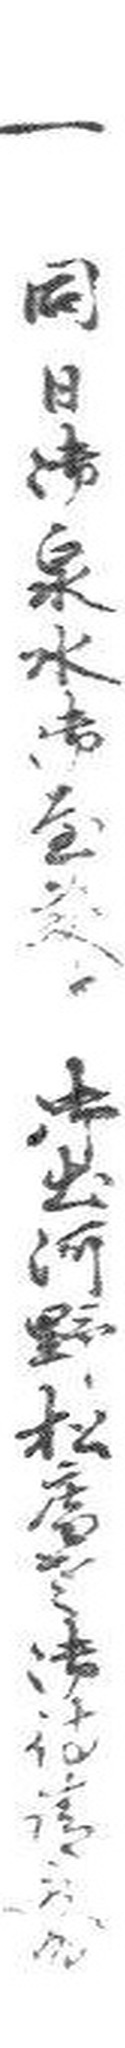一同日御泉水御屋敷江御出河野松庵老御待請被成
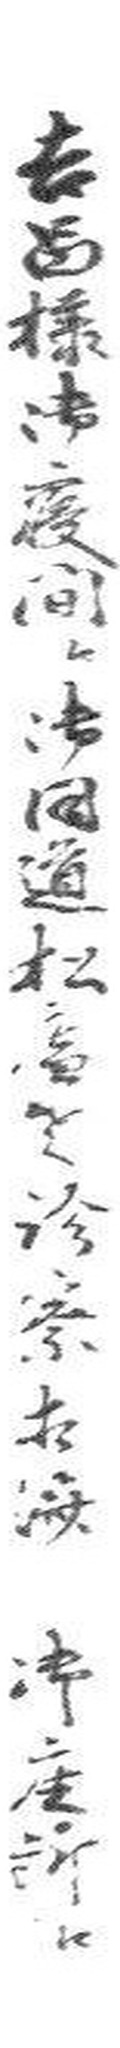吉品様御寝間江御同道松庵老診察相済御座所江
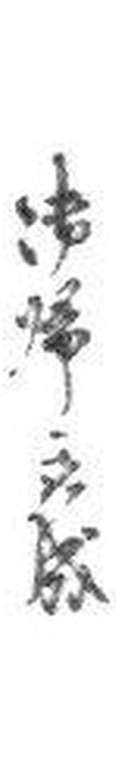御帰被成
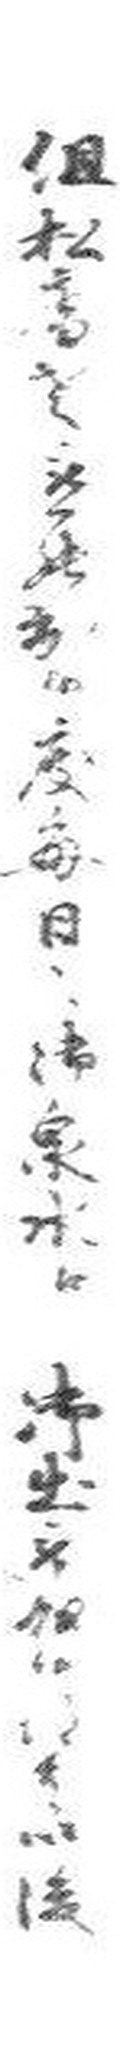但松庵老被罷出候度毎日々御泉水江御出被成候得共以後
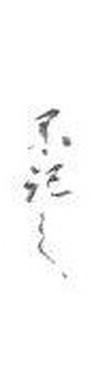不記之
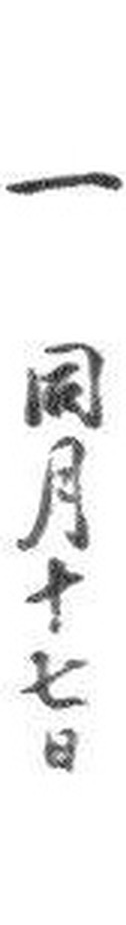一同月十七日
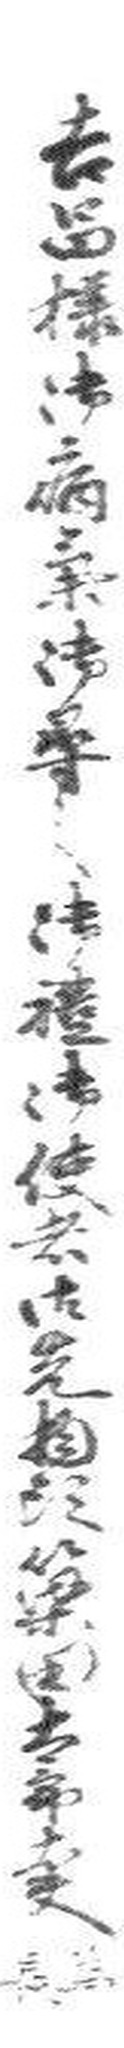吉品様御病気御尋之御礼御使者御先物頭簗田太郎大夫為長
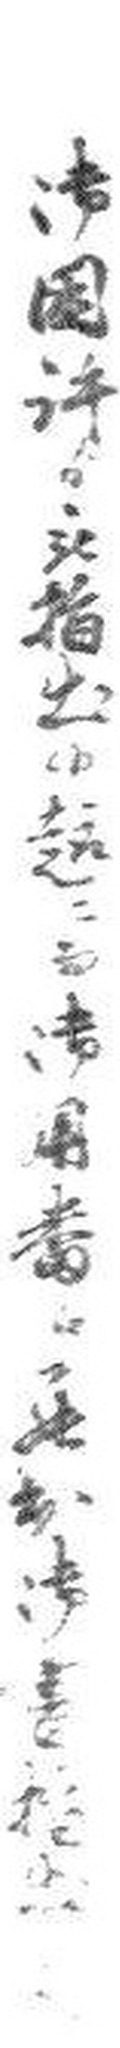御国許ゟ被指出候趣ニ而御用番江罷出御書指出之
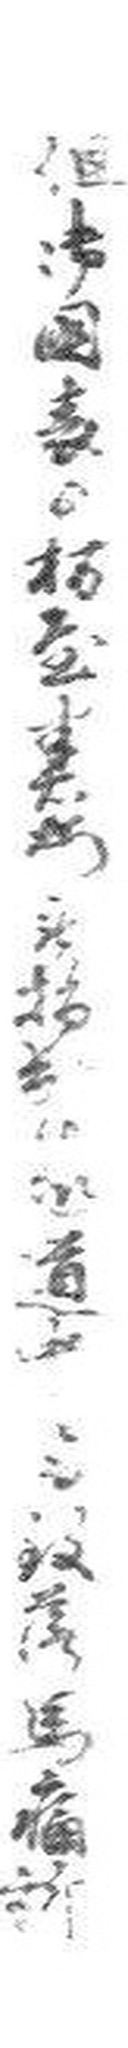但御国表ゟ栃屋半右衛門被指出候処道中ニ而致落馬痛所
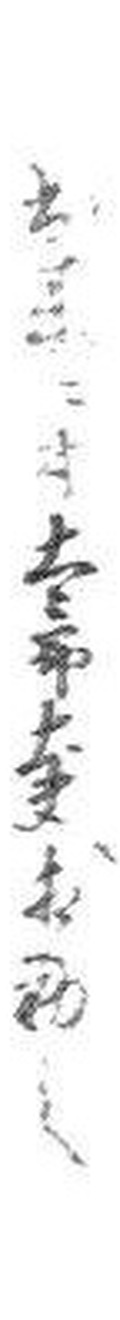出来ニ付太郎大夫相勤之
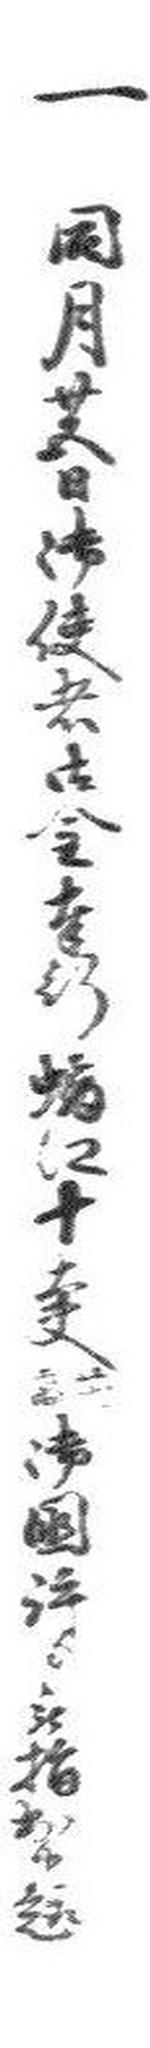一同月廿五日御使者御金奉行蟹江十大夫茂斎御国許ゟ被指出候趣
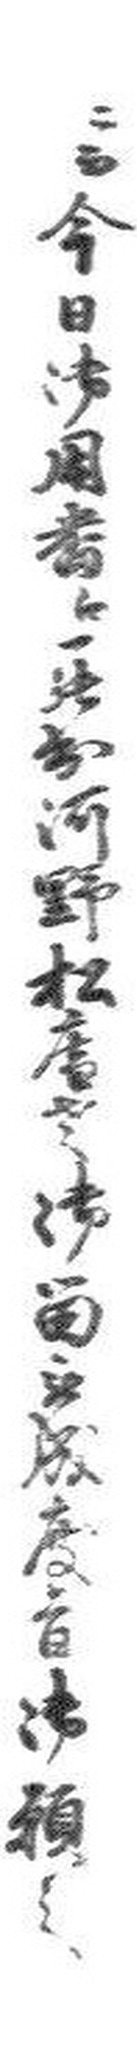ニ而今日御用番江罷出河野松庵老御留被成度旨御願之
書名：家譜 二十八 吉邦公 従宝永七年七月五日到正徳元年十二月
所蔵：福井県文書館 Fukui Prefectural Archives
